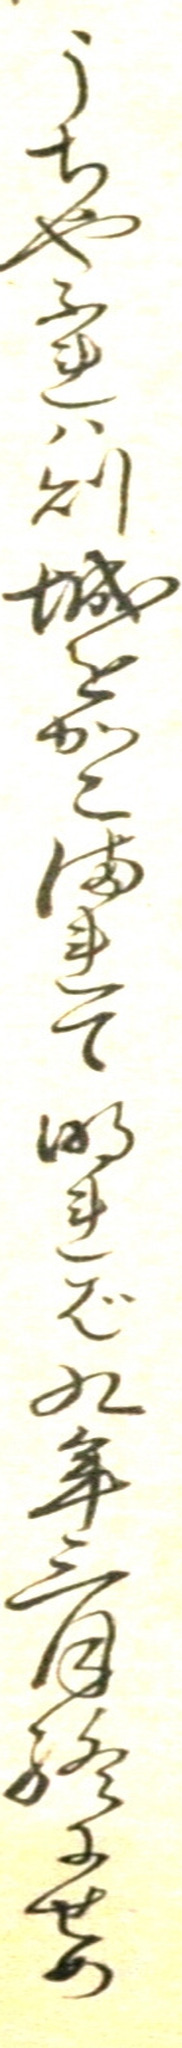うちやふれは則城をかこまれて明れば九年三月終にせめ
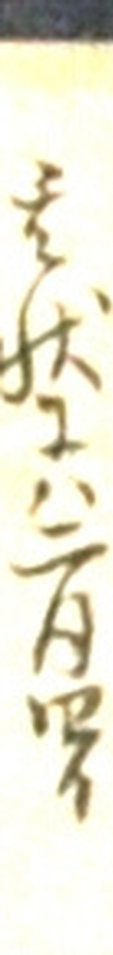其状には二月四日
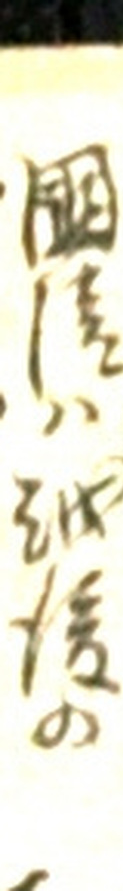国清は越後の
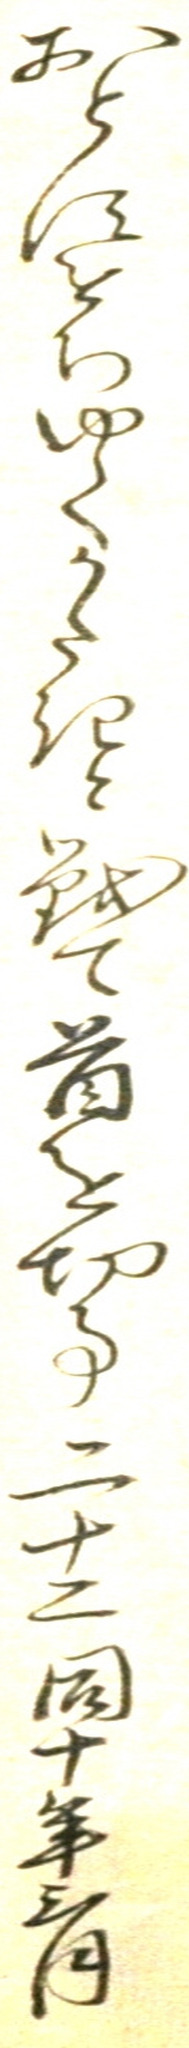おとすをちゆくかたきと戦て首を切事二十二同十年三月
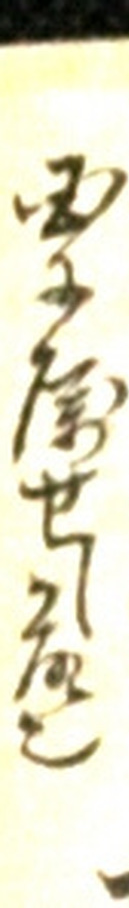国に属せしか故也
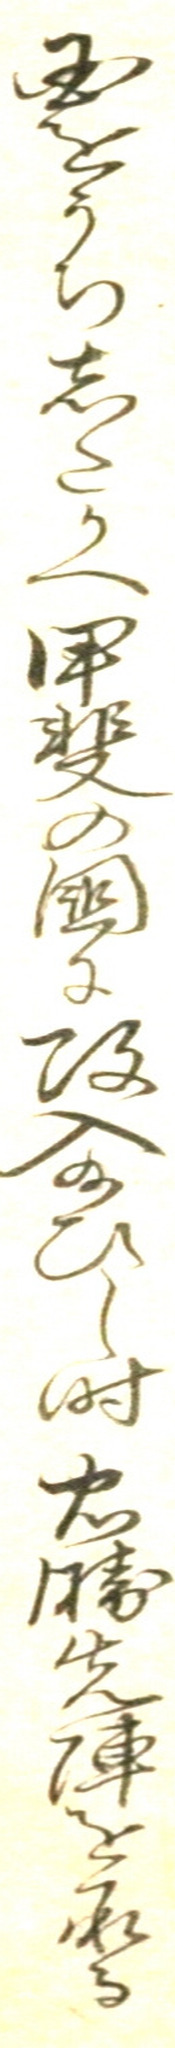国をうちしたかへ甲斐の国に攻入給ひし時忠勝先陣を承る
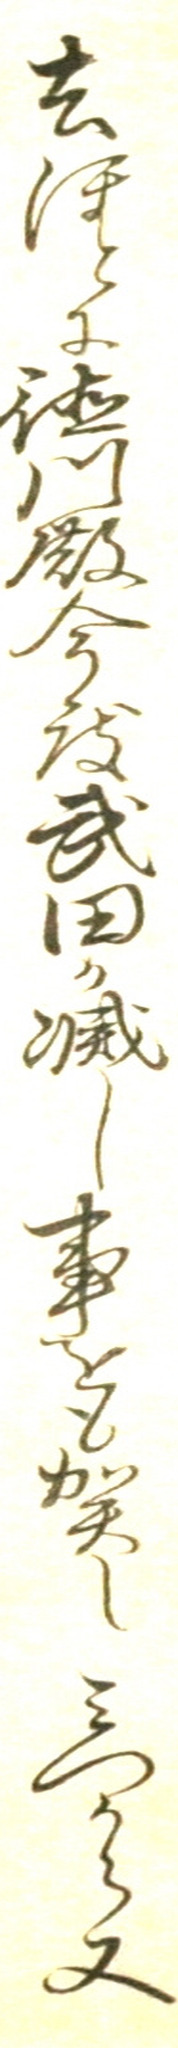去ほとに徳川殿今度武田か滅し事をも賀しみつから又
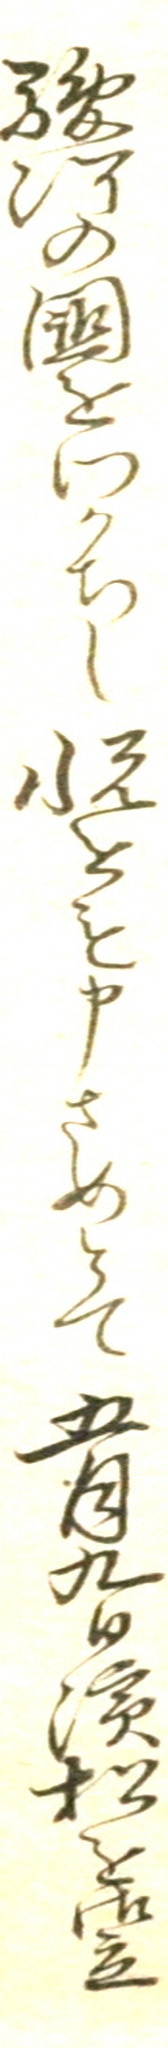駿河の国をわかちし悦をも申さめとて五月九日浜松を御立
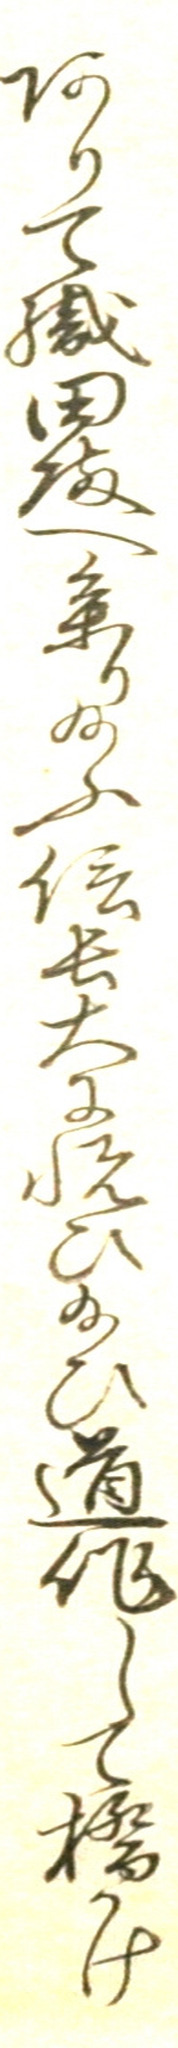ありて織田殿へ参り給ふ信長大に悦ひ給ひ道作して橋かけ
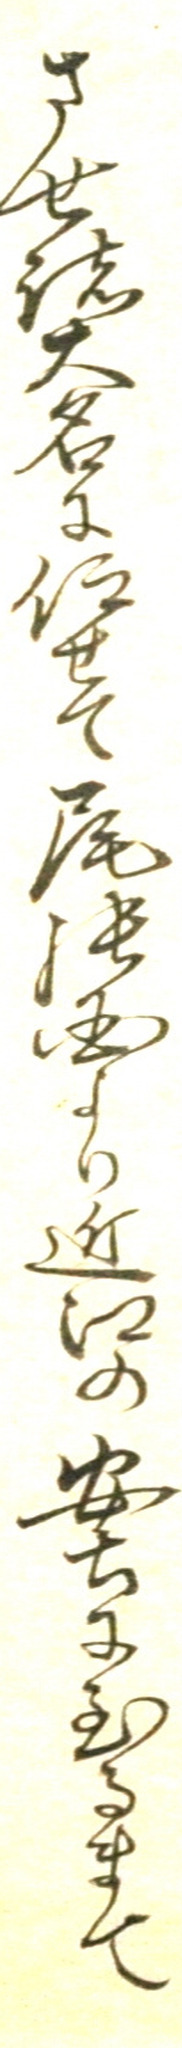させ諸大名に任せて尾張国より近江の安土に至るまて
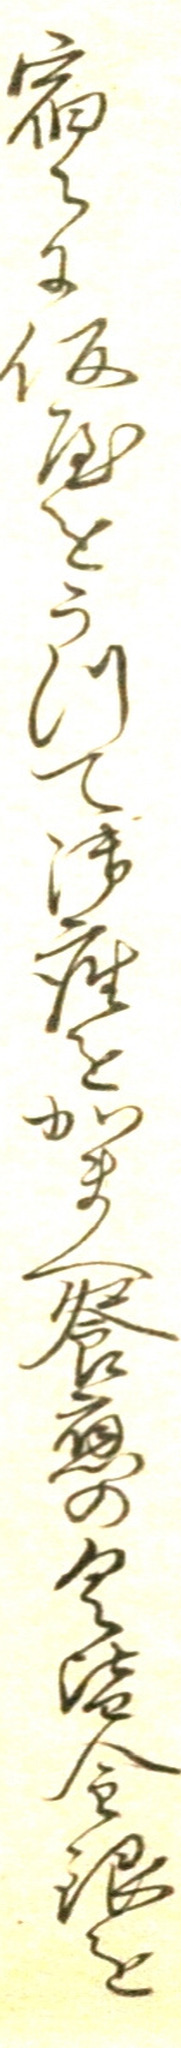宿々に仮屋をうつて御座をかまへ饗応の具皆金銀を
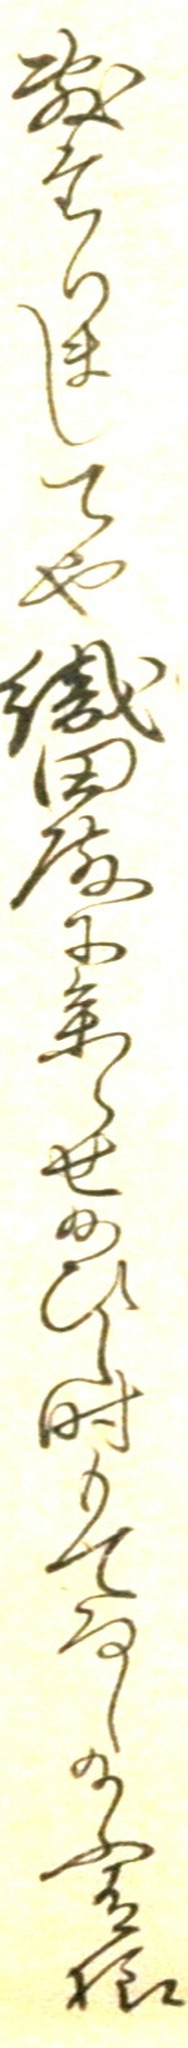敷たりましてや織田殿に参らせ給ひし時もてなし給ふ有様
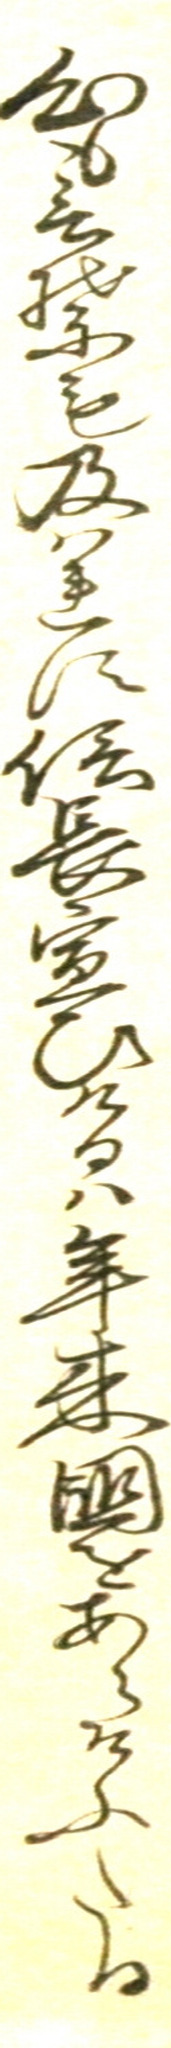心も言葉も及はれす信長宣ひけるは年来国をあらそふたる
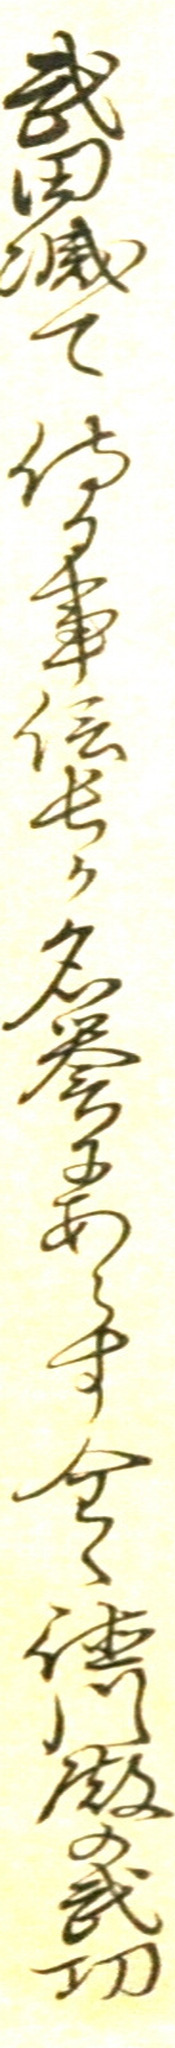武田滅て侍る事信長か名誉にあらす全く徳川殿の武功

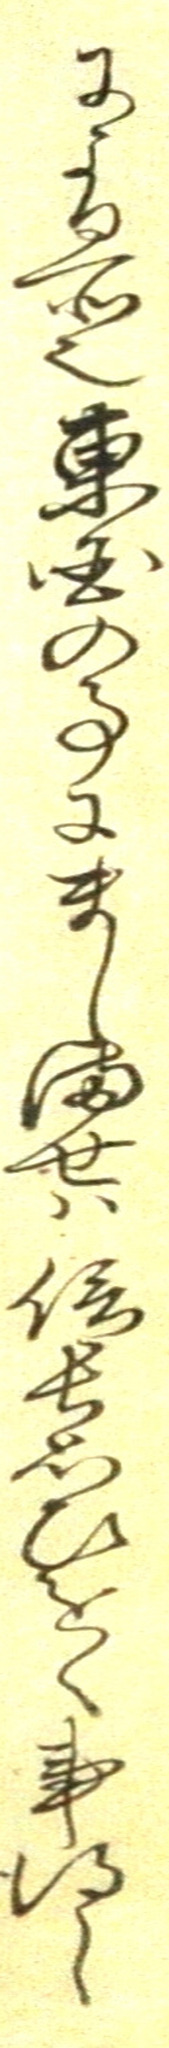による所也東国の事にましませは信長思ひをく事得し
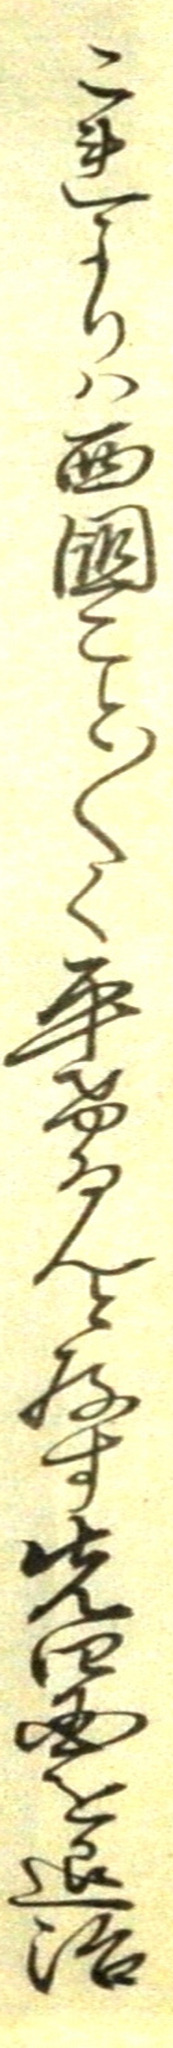これよりは西国こと〳〵く平けなんと存す先四国を退治
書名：藩翰譜（四・上）
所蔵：伊那市立高遠町図書館・合同会社AMANE
